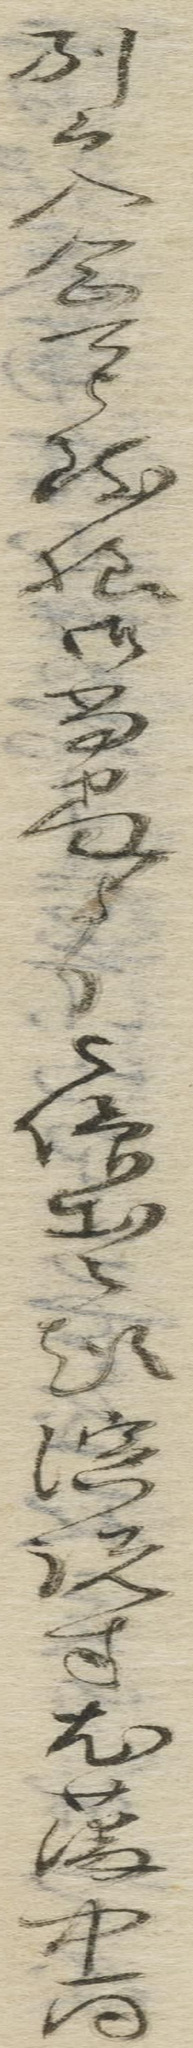別而入念可被致様御当番より被仰出候趣演説す尤藩中一同
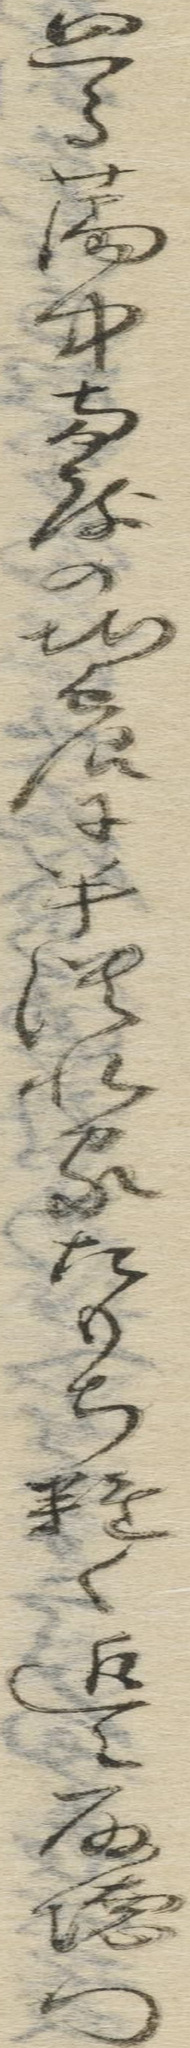回る藩中両度の地震に半潰れ家たもち難く追々取壊つ
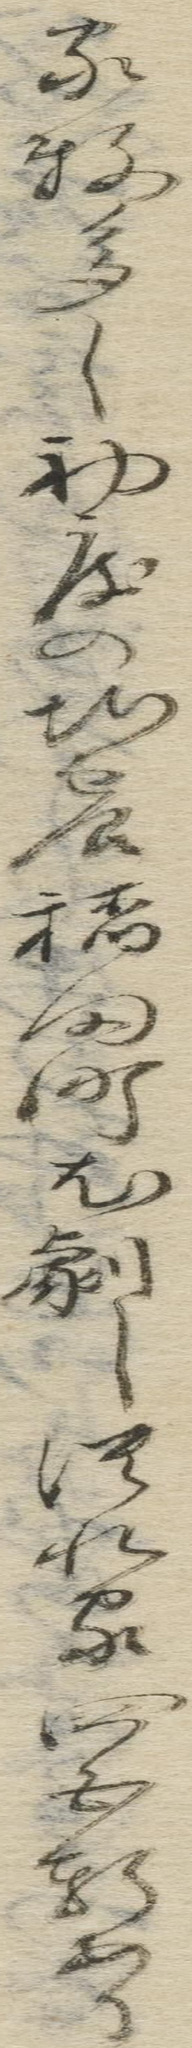家多し初度の地震稲田町尤劇し潰れ家四五軒あり
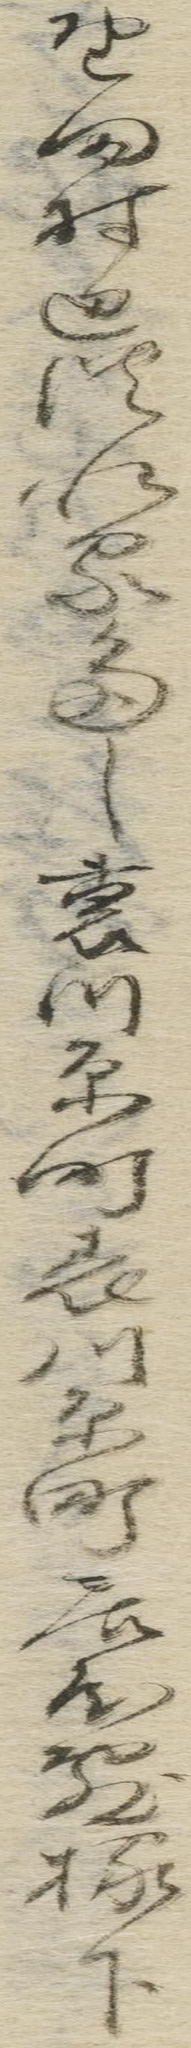野田村辺潰れ家多し裏河原町表河原町居屋敷縁下
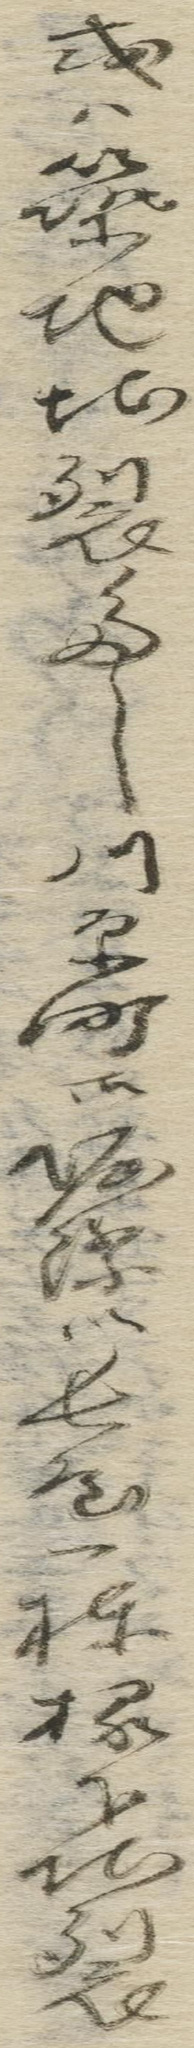或ハ築地地割多し河原町御堀際ハ長屋一棟縁下地割
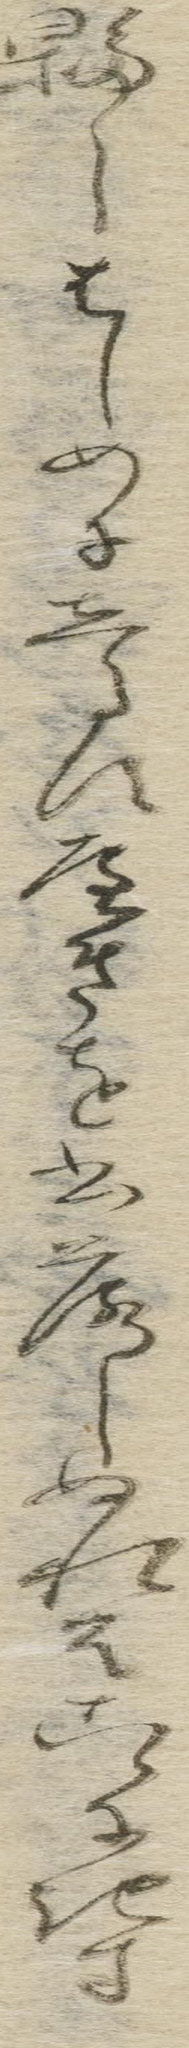夥しはしめにしるすへきを書落しぬれはこゝに記す
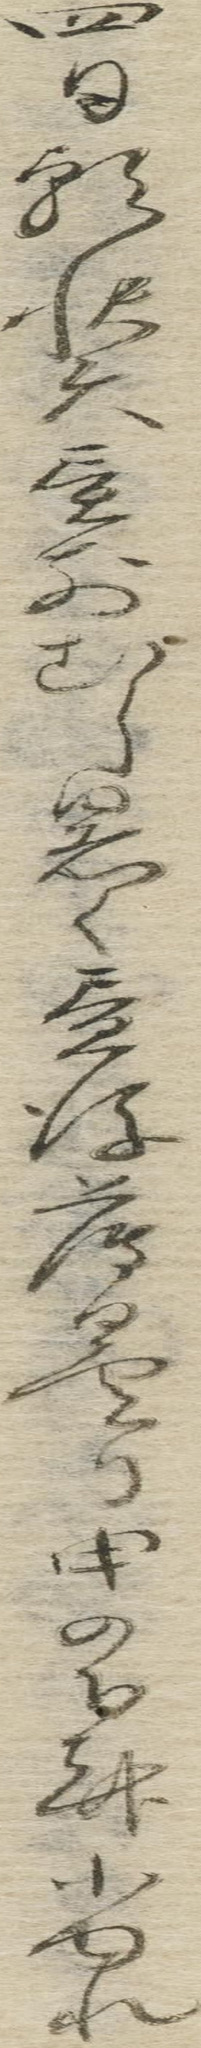四日朝快天昼前むし暑く昼後薄曇り申の下刻小ゆれ
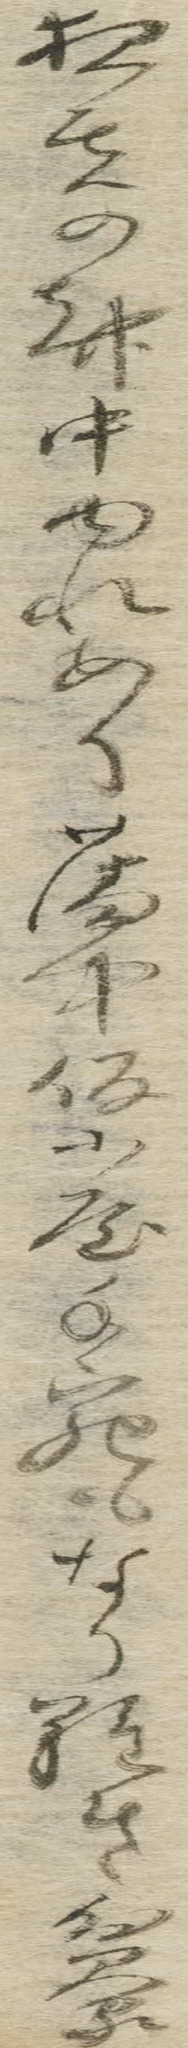夜亥の刻中ゆれあり藩中仮小屋手宛もなり難き物見家
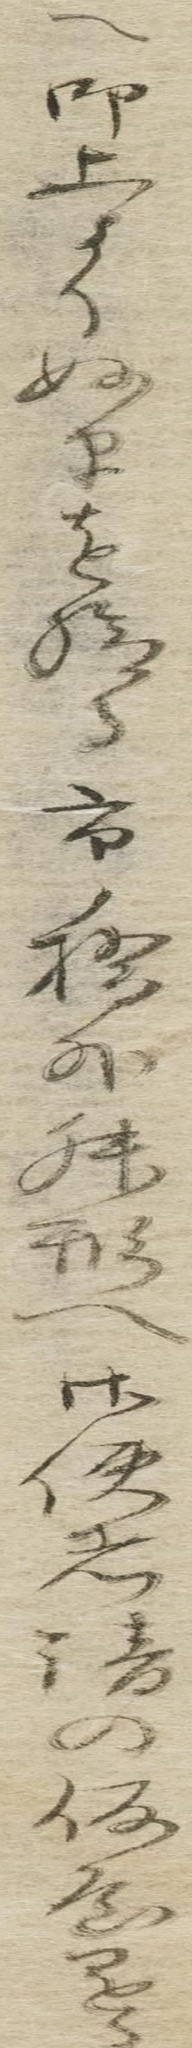へ御上よりぬまを給る市ノ橋外升形へ御使者凌の仮屋懸る
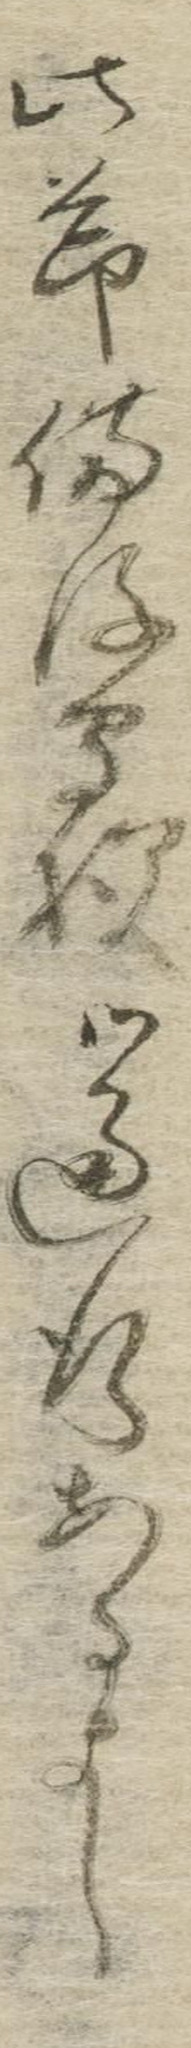此節備後守様御通行あるよし
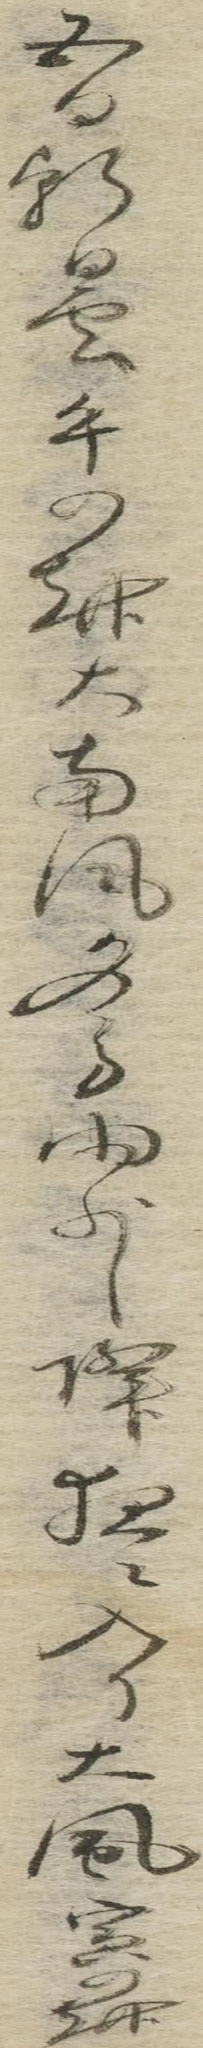五日朝曇午の刻大南風夕方雨少し降夜二入り大風寅の刻

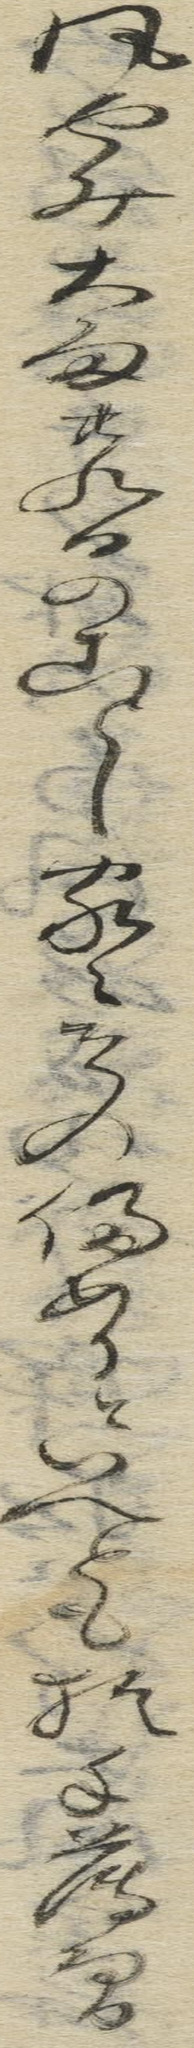風やみ大雨廿九日のこし家々その傷ありといへとも猶手落たる
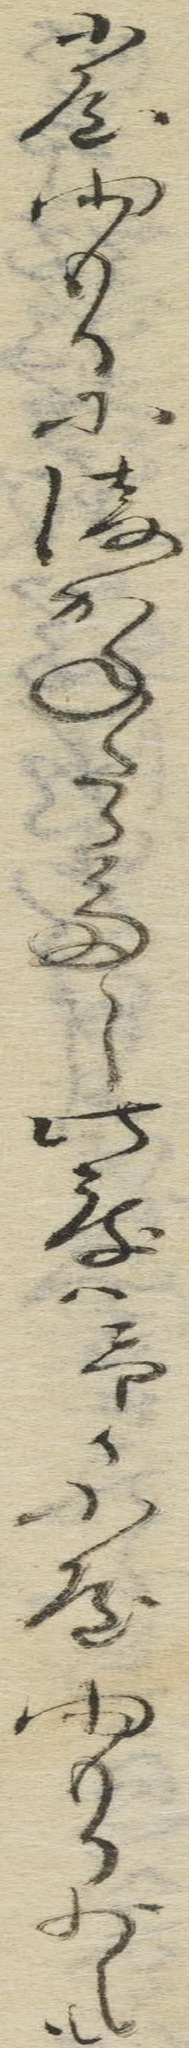小屋雨もりに凌かねたる多し此度ハ予か小屋雨もり少しも
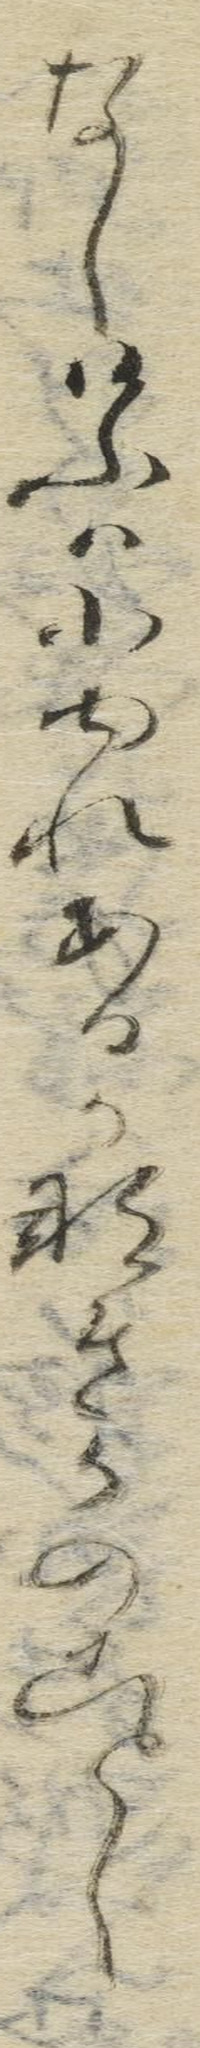なしけふハ小ゆれあるかなきかのことし
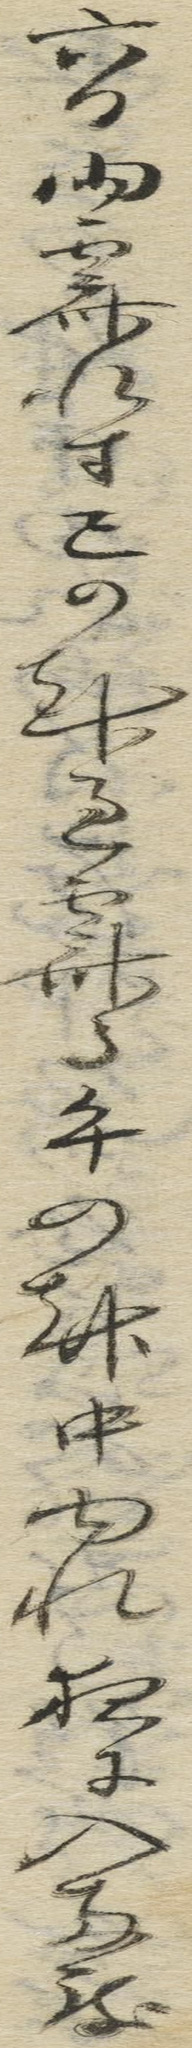六日雨霽れす巳の刻過霽る午の刻中ゆれ夜二入両度
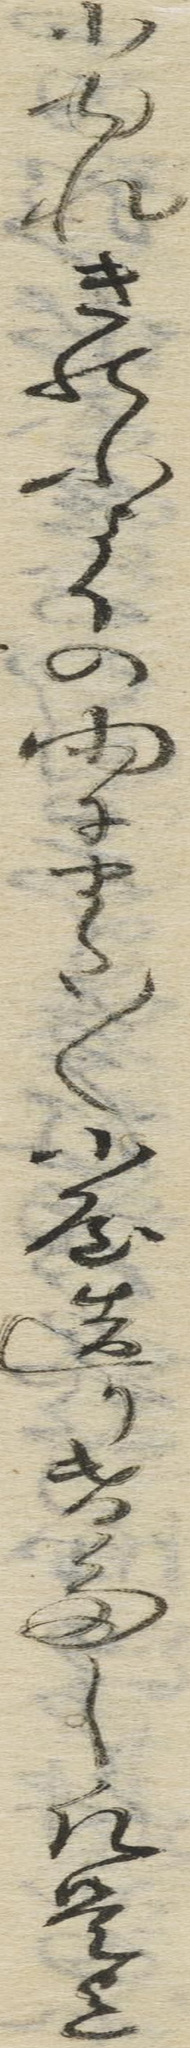小ゆれきのふよりの雨にまた〳〵小屋造り替多し凡是迄
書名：弘化丁未天變日記
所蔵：東京大学地震研究所図書室 Earthquake Research Institute Library, The University of Tokyo, JAPAN
